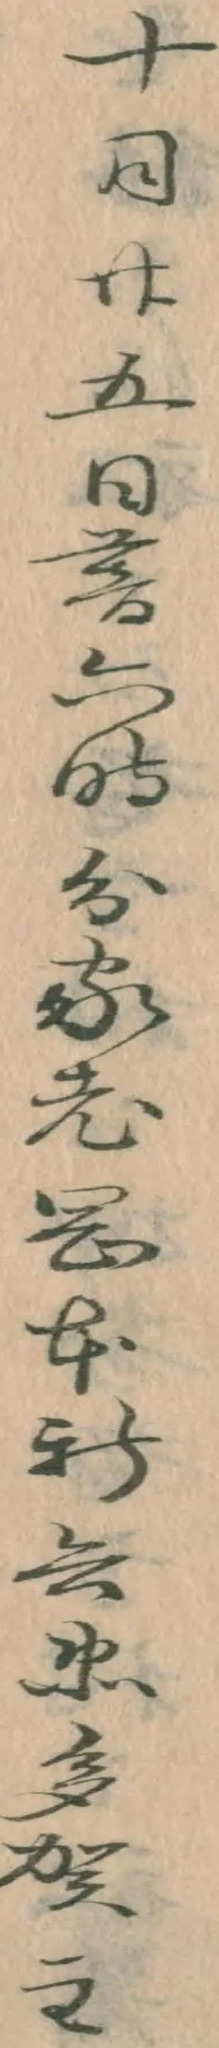十月廿五日暮六時分家老岡本新兵衛多賀主
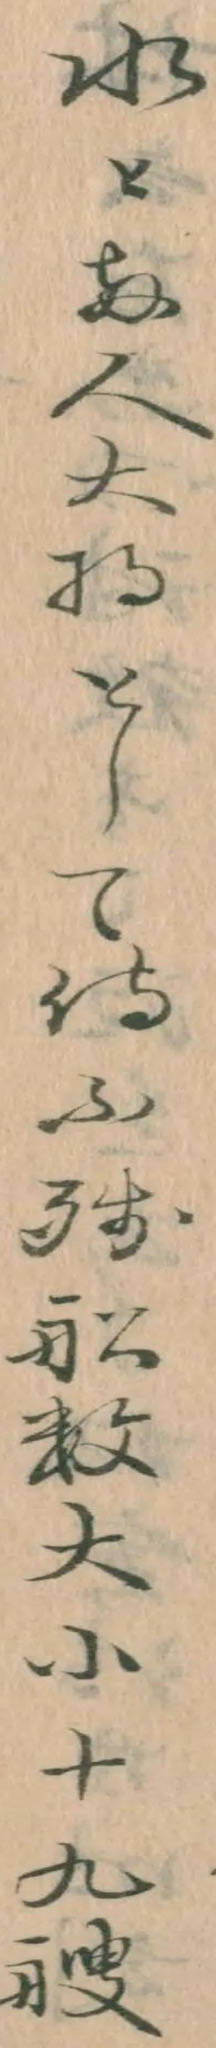水と両人大将として侍不残船数大小十九艘
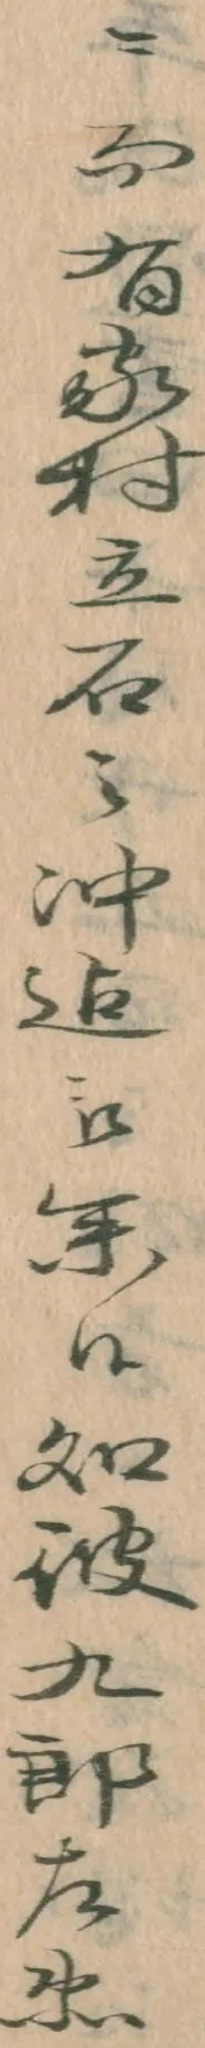に而有家村立石之沖迄え参候処彼九郎左衛
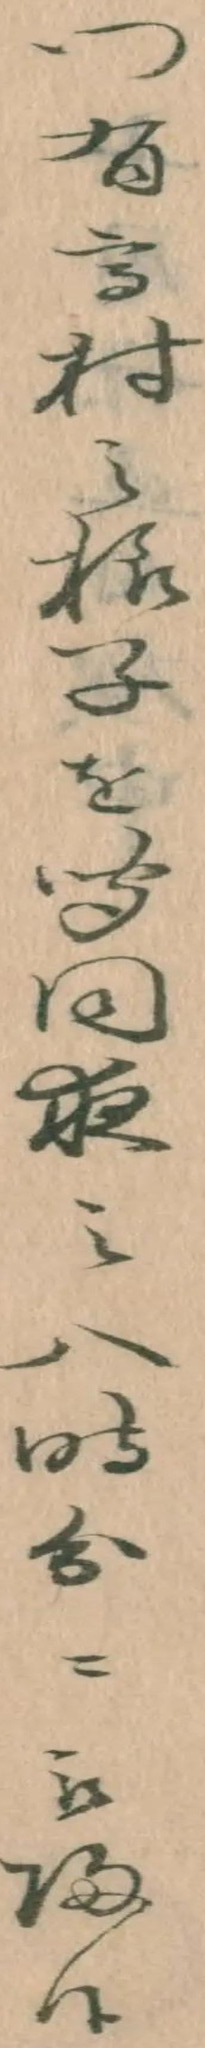門有馬村之様子を聞同夜之八時分に被帰候
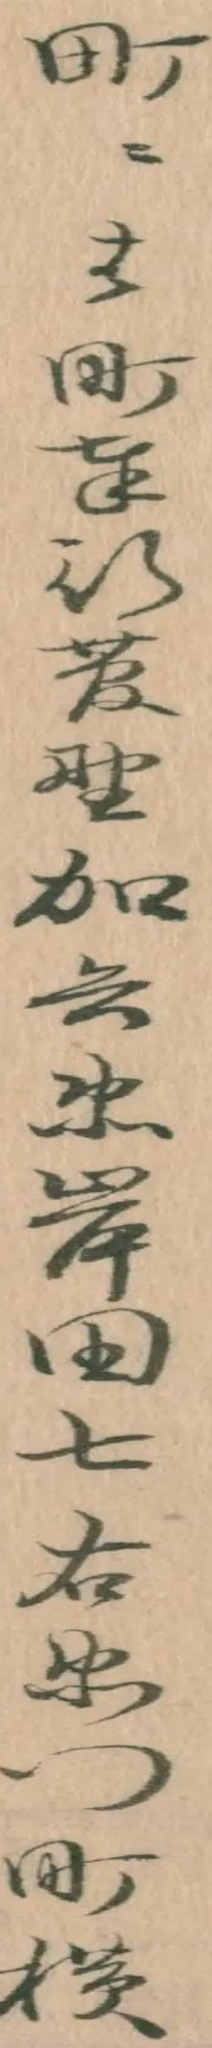町には町奉行菅野加兵衛岸田七右衛門町横
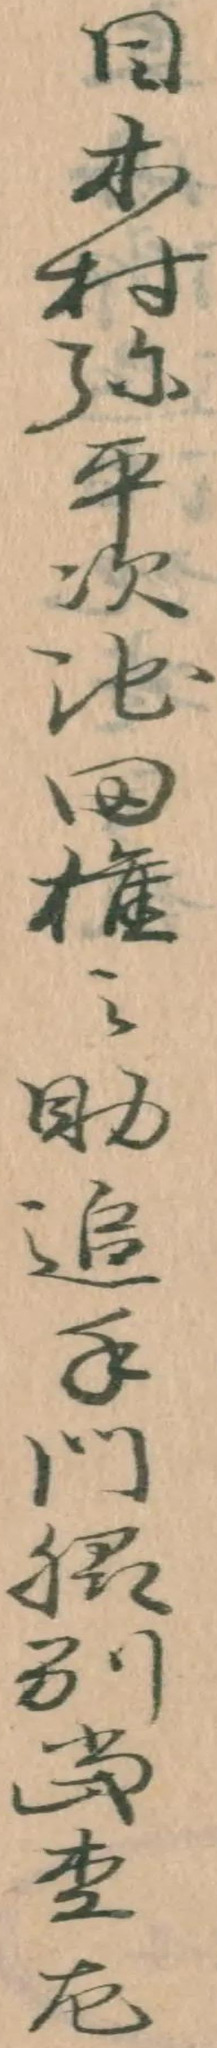目木村弥平次池田権之助追手門脇別当杢左
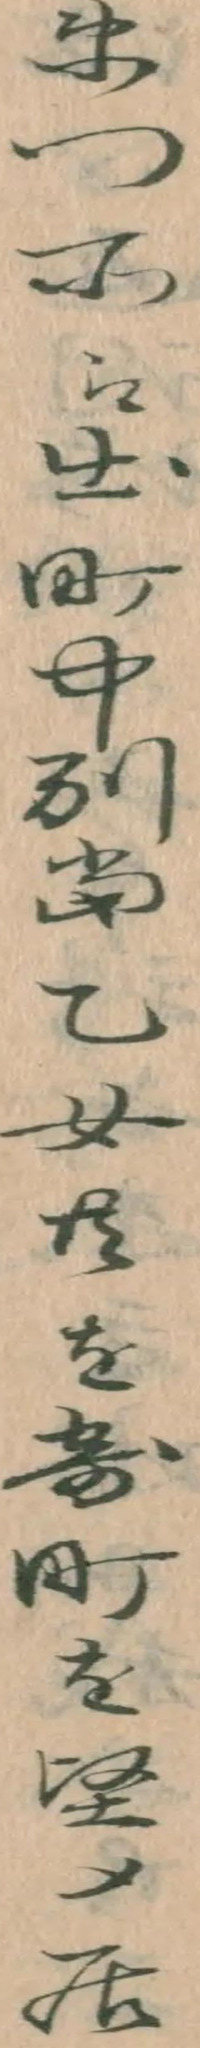衛門所え出町中別当乙女共を寄町を堅め居
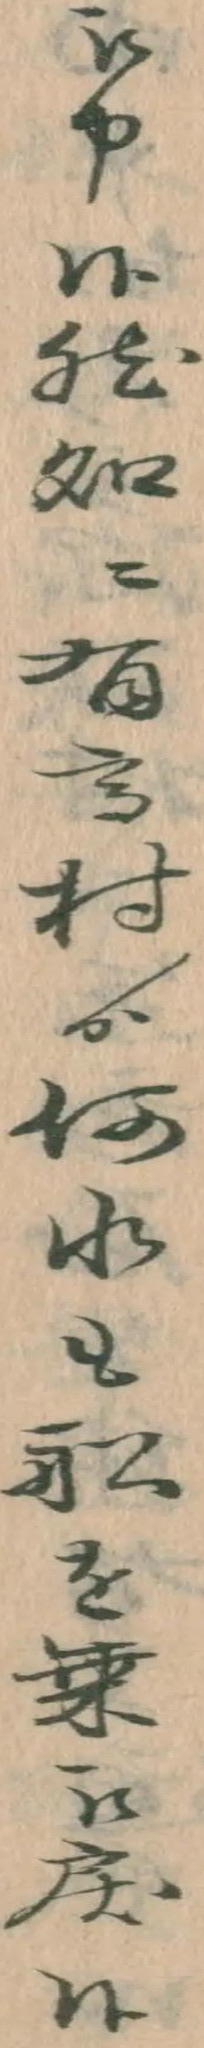被申候然処に有馬村ゟ何れも船を乗被戻候
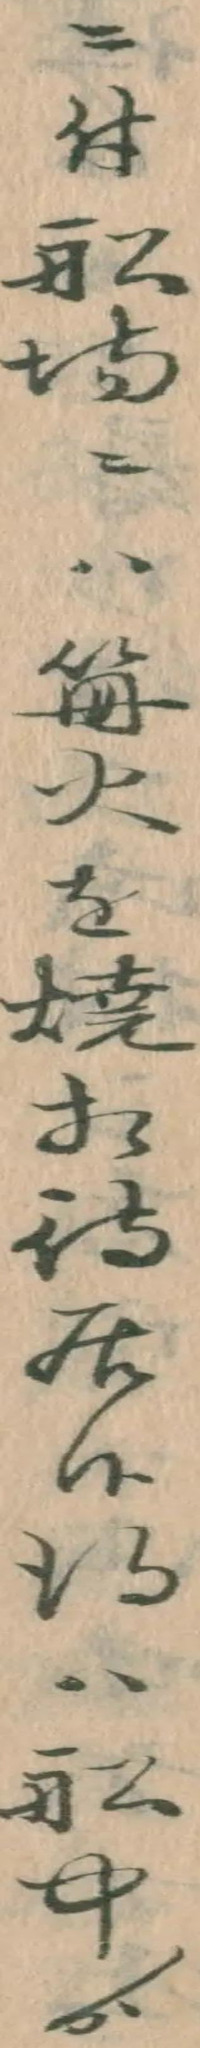に付船場には篝火を焼相待居候得は船中ゟ
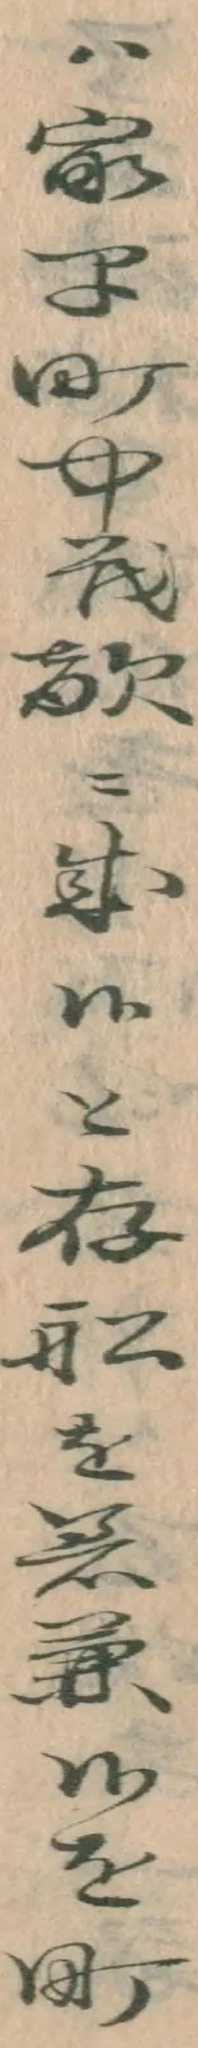は最早町中も敵に成候と存船を着兼候を町
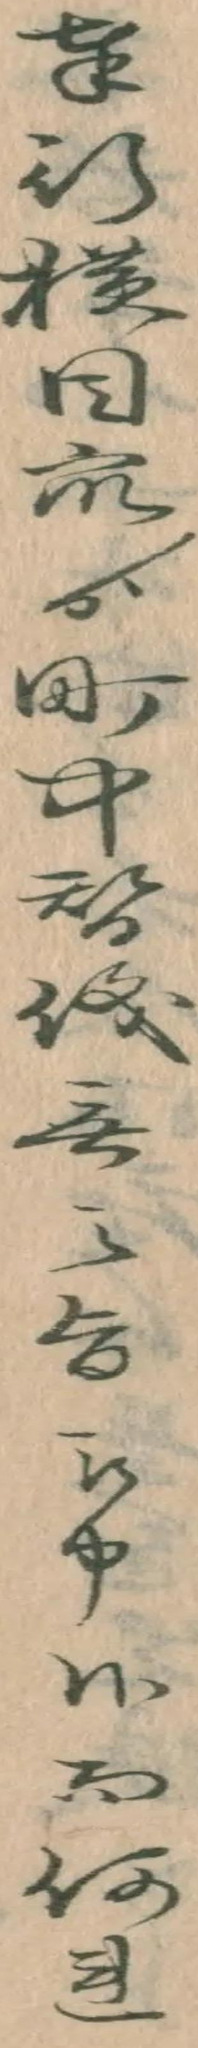奉行横目衆ゟ町中替儀無之旨被申候而何れ
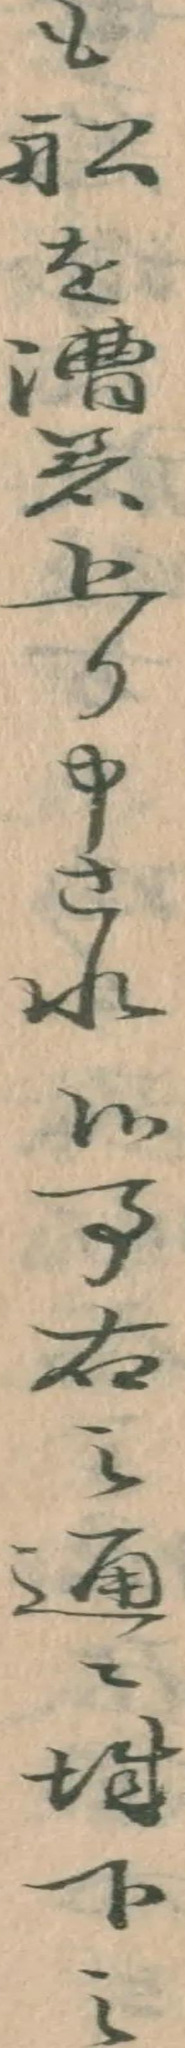も船を漕着上り申され候事右之通に城下之
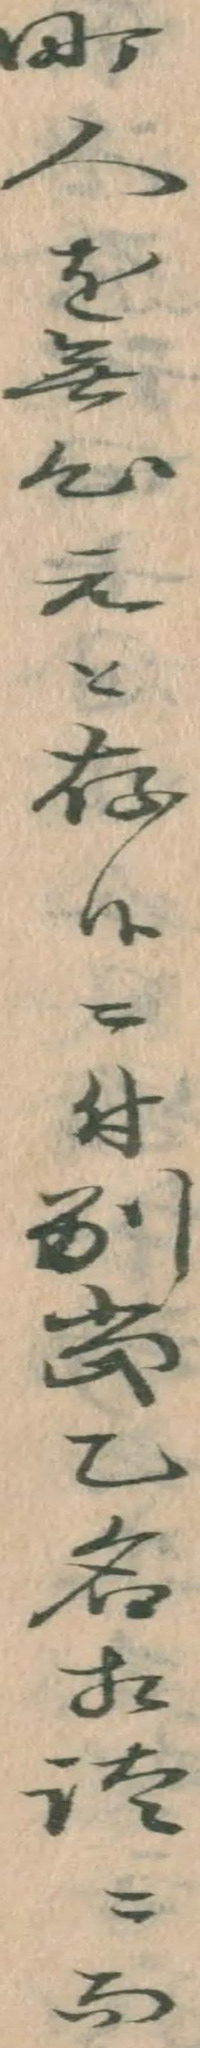町人を無心元と存候に付別当乙名相談に而
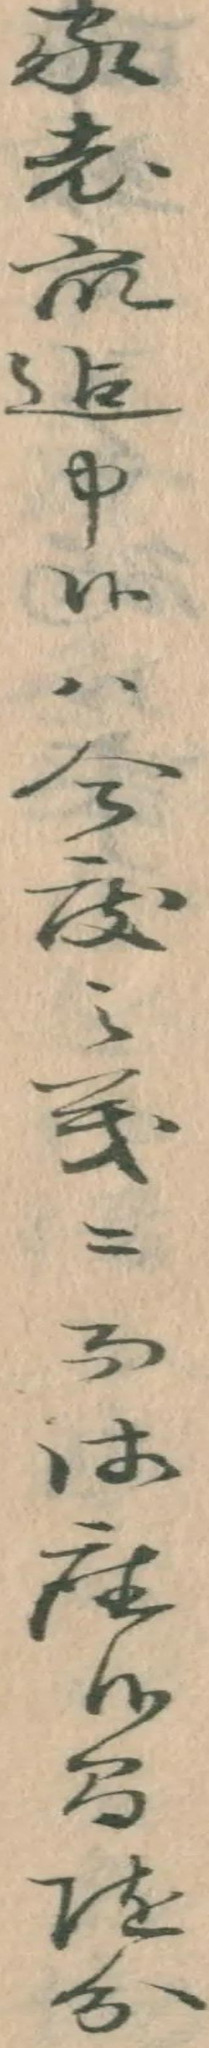家老衆迄申候は今度之義に而御座候間随分
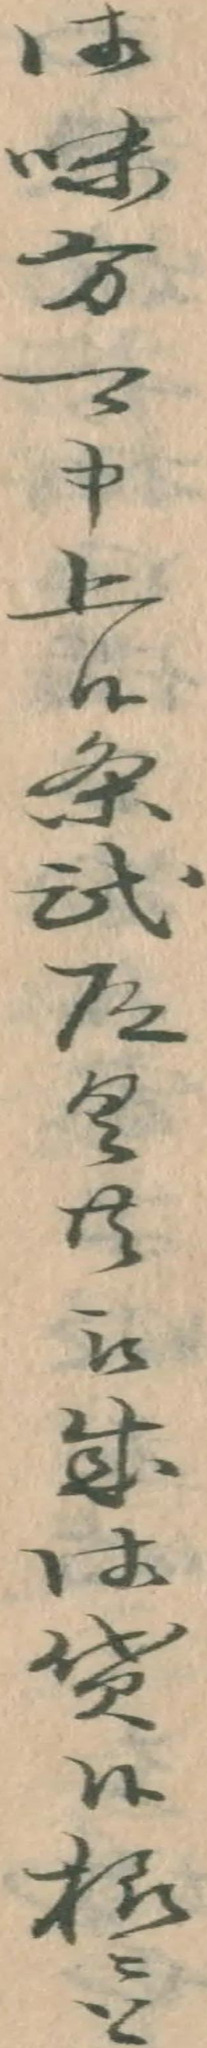御味方可申上候条武道具共被成御貸候様にと
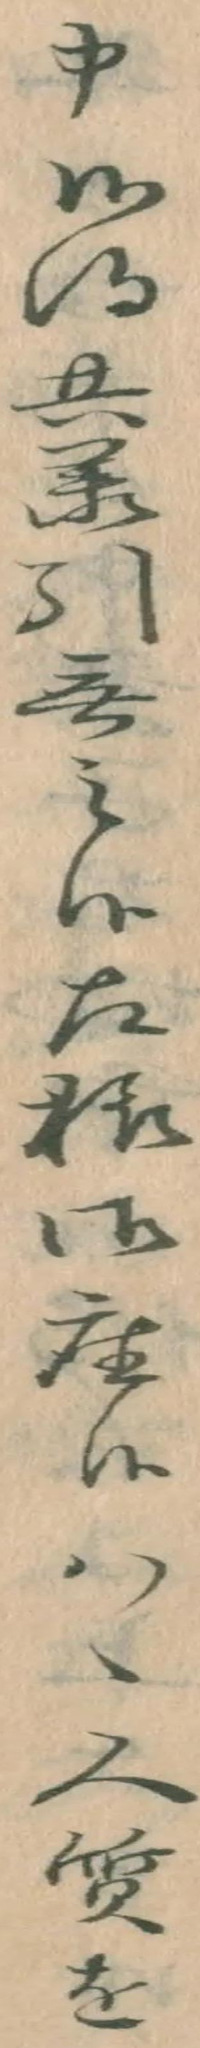申候得共承引無之候左様御座候はゝ人質を
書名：切支丹御退治記 49巻. [1]
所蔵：国立国会図書館 National Diet Library, JAPAN
